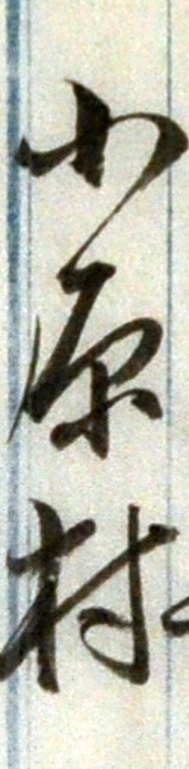小原村
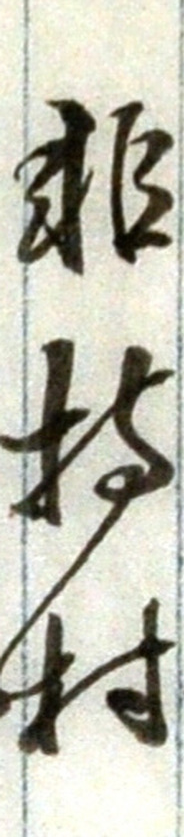非持村
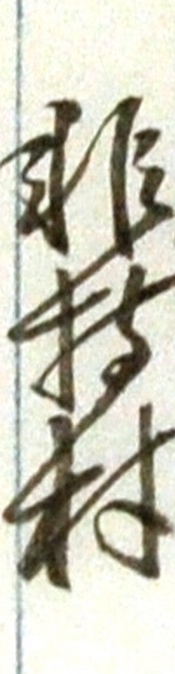非持村
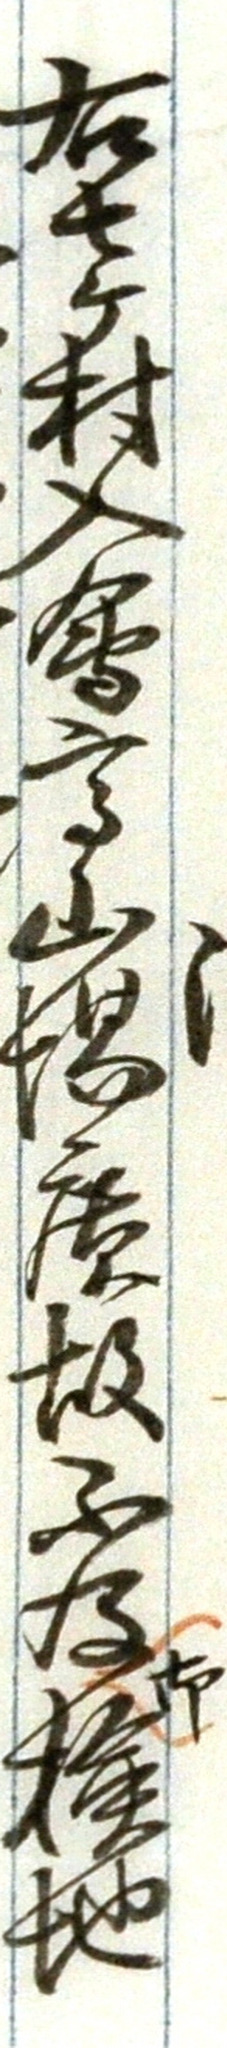右七ケ村入会高山場広故不及御検地
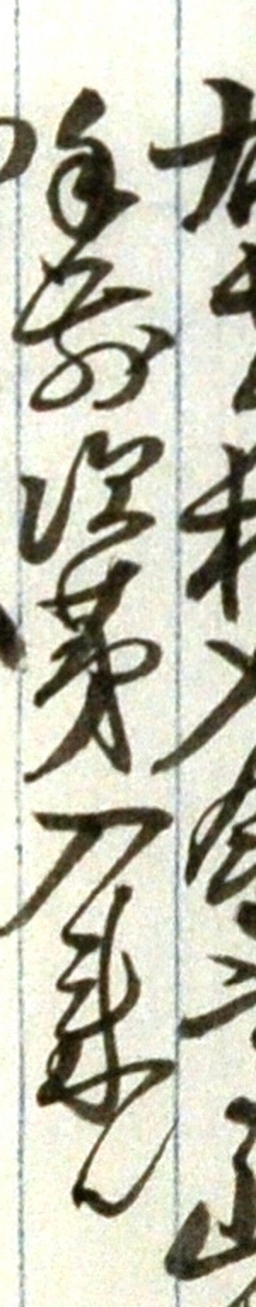手前次第入来也

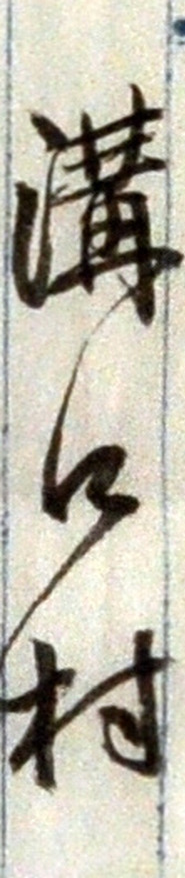溝口村
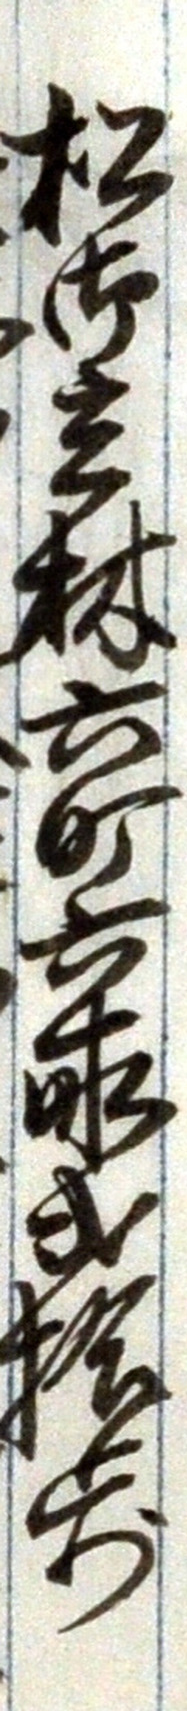松御立林六町六畝弐拾歩七ケ所
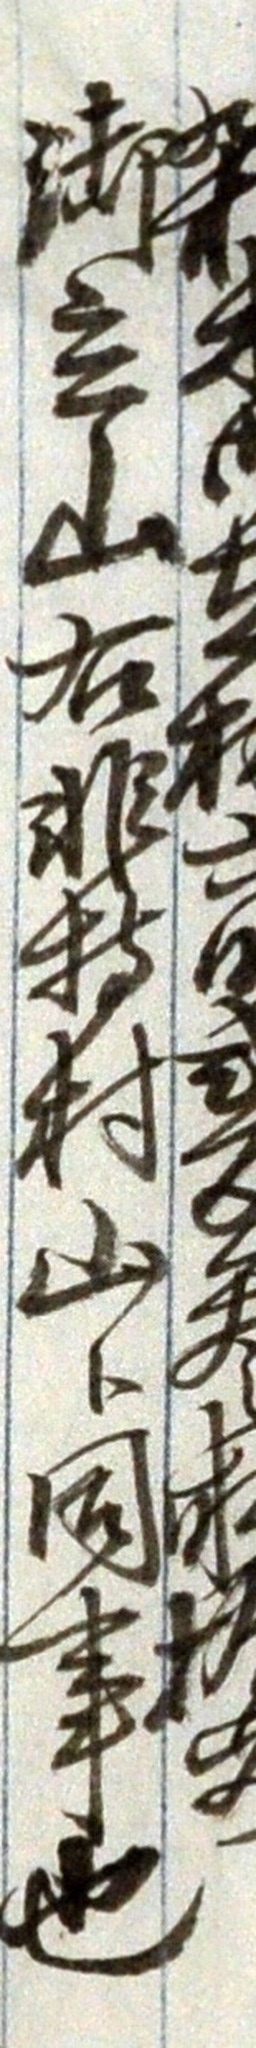御立山右非持村山ト同事也
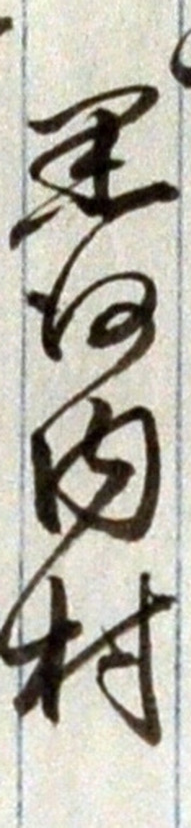黒河内村
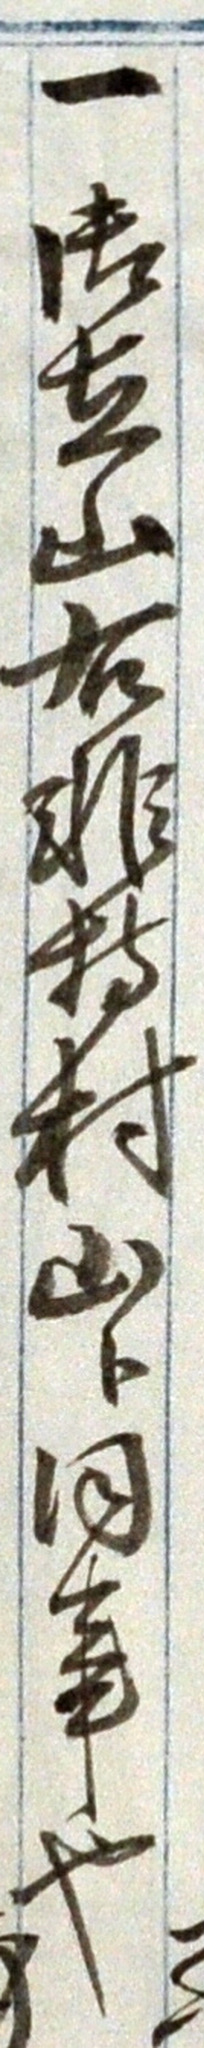一御立山右非持村山ト同事也
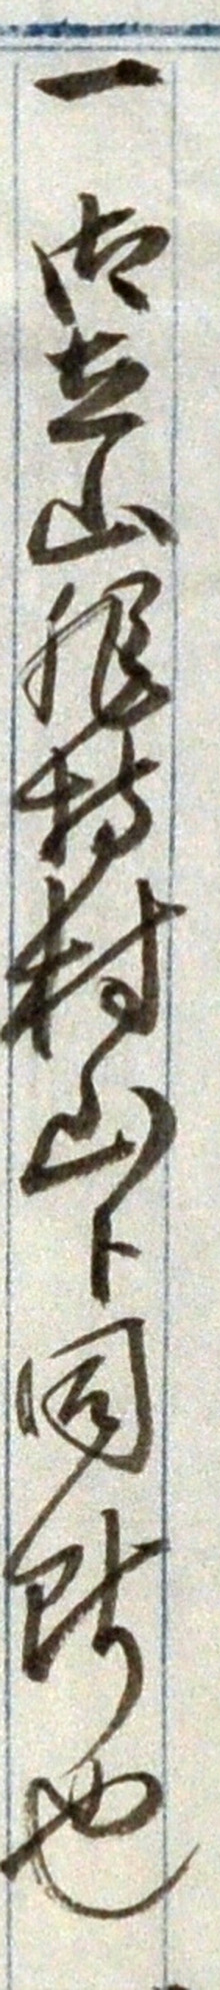一御立山非持村山ト同断也
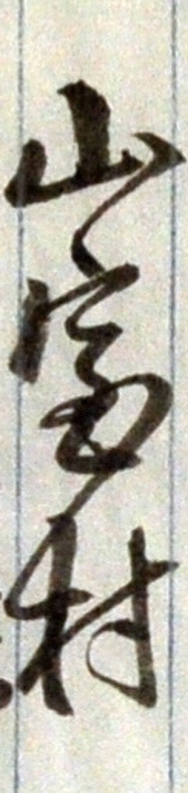山室村
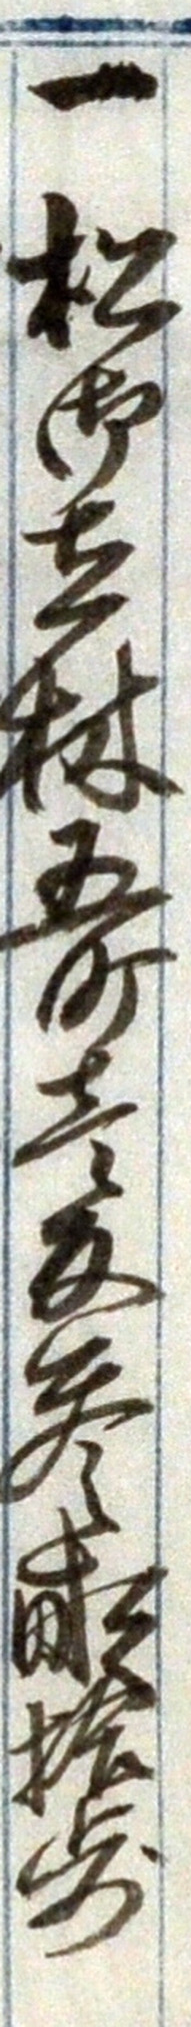一松御立林五町壱反参畝拾歩壱ケ所
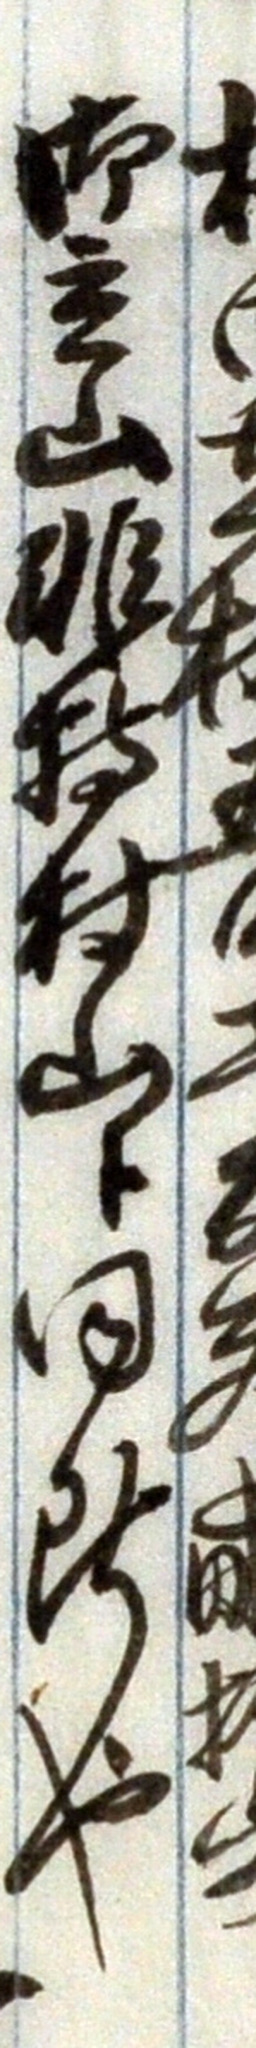御立山非持村山ト同断也
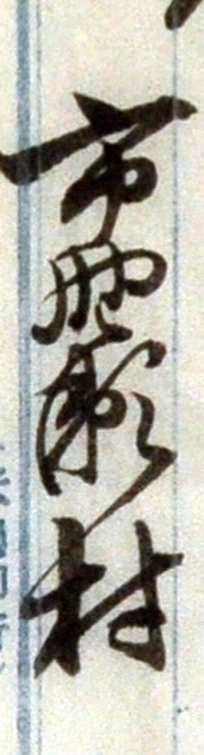市野瀬村
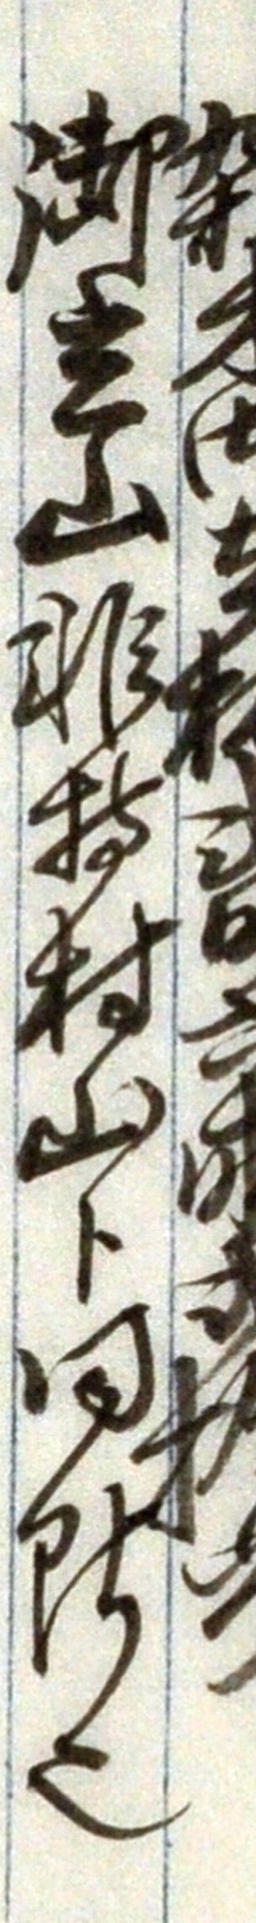御立山非持村山ト同断也
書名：御山帳
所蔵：伊那市立高遠町図書館・合同会社AMANE
